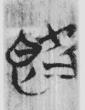既
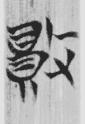敗
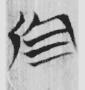於
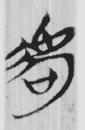唬
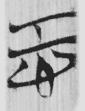{工心}
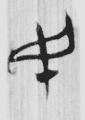民
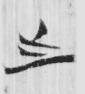之
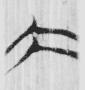大
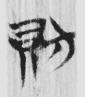{貝方}
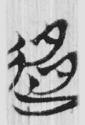迻
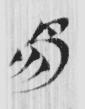易
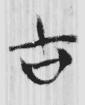古
